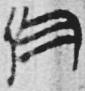於（猗）
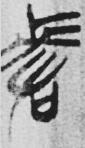差（嗟）
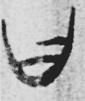曰
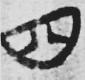四
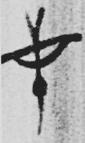矢
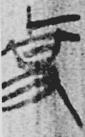弁（反）
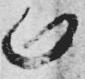㠯（以）
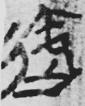○（禦）
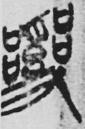○（亂）
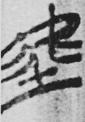○（吾）
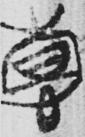憙（喜）
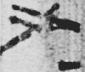之
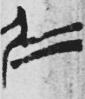○（鳲）
